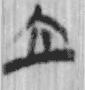立（位）
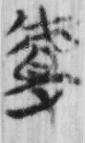○（且）
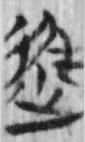○（徙）
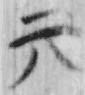亓（其）
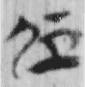凥
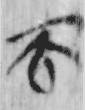而
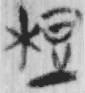梪
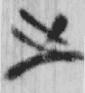之
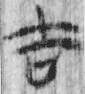吉
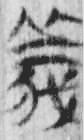義
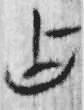占
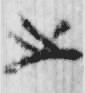之
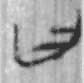曰
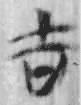吉
